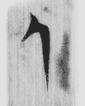人
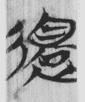{彳睘}
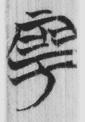𩁹
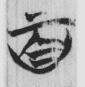百
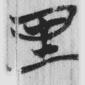里
